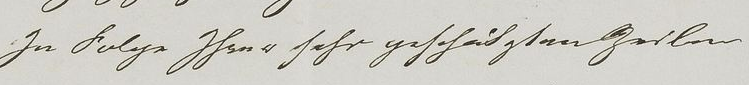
In Folge Ihrer sehr geschätzten Zeilen
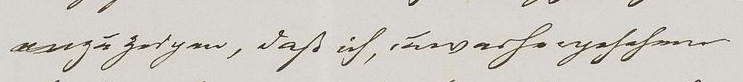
anzuzeigen, daß ich, unvorhergesehene
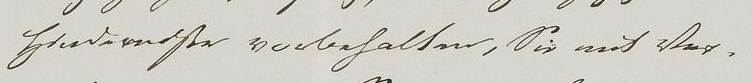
Hinderniße vorbehalten, Sie mit Ver-
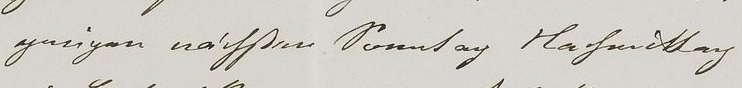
gnügen nächsten Sonntag Nachmittag
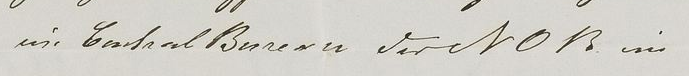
im Central Bureau der NOB. im
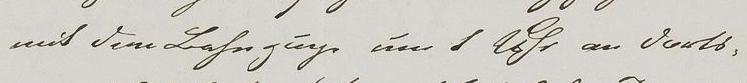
mit dem Bahnzuge um 1 Uhr an dorti-
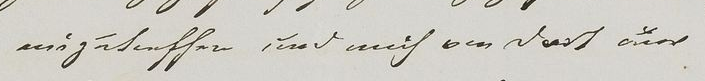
einzutreffen und mich von dort aus
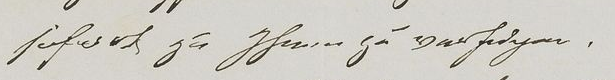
sofort zu Ihnen zu verfügen.
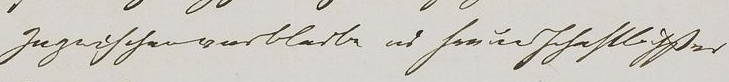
Inzwischen verbleibe in freundschaftlichster
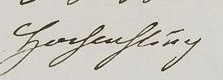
Hochachtung
